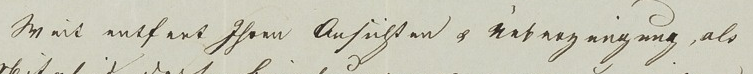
Weit entfert Ihren Ansichten & Ueberzeugung, als
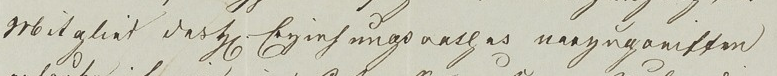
Mitglied des H: Erziehungsrathes vorzugreiffen
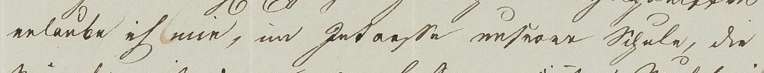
erlaube ich mir, im Intresse unserer Schule, die
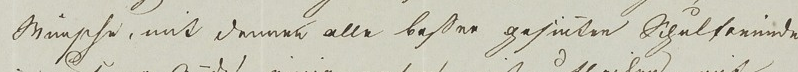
Wünsche, mit denen alle besser gesinnten Schulfreunde
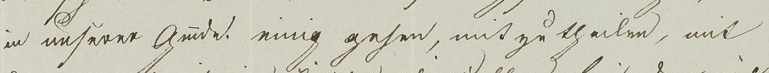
in unserer Gmde. einig gehen, mit zu theilen, mit
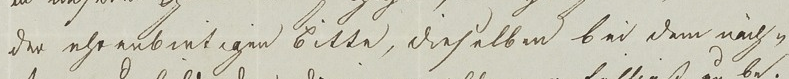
der ehrerbietigen Bitte, dieselben bei dem näch-
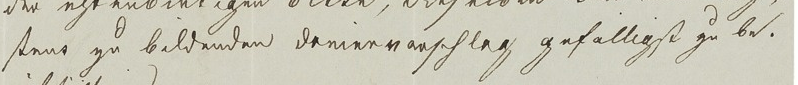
stens zu bildenden Dreiervorschlag gefälligst zu be-
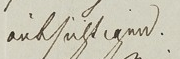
rüksichtigen.
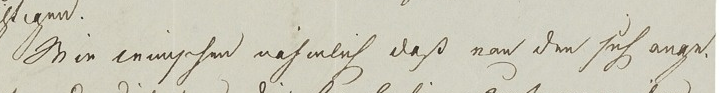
Wir wünschen nähmlich daß von den sich ange-
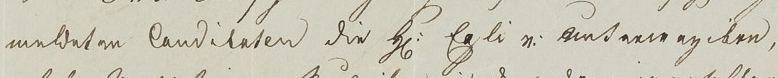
meldeten Candidaten die H: Egli v: Unterwezikon,
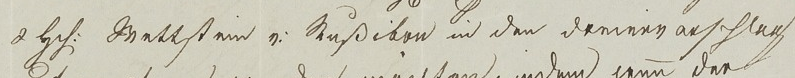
& Hch: Wettstein v: Rußikon in den Dreiervorschlag
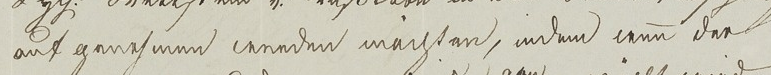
aufgenohmen werden möchten, indem wenn der
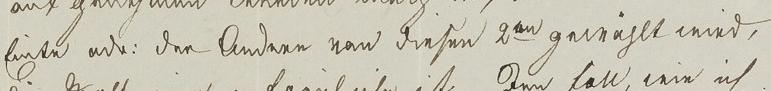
Einte od: der Andere von diesen 2en gewählt wird,
